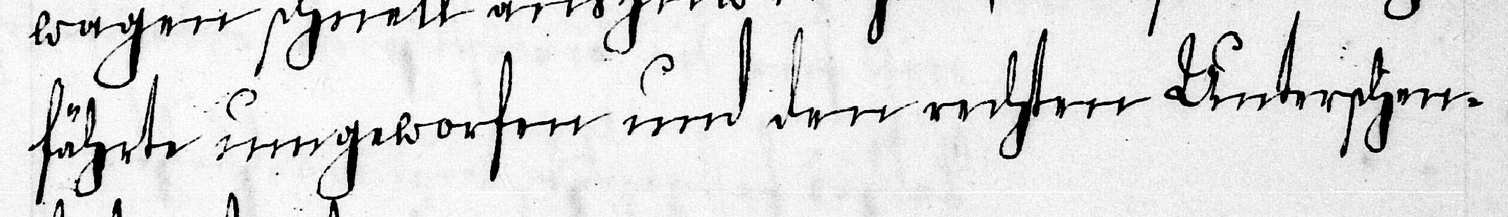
fährte umgeworfen und den rechten Unterschen¬
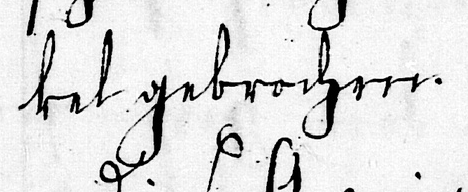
kel gebrochen.
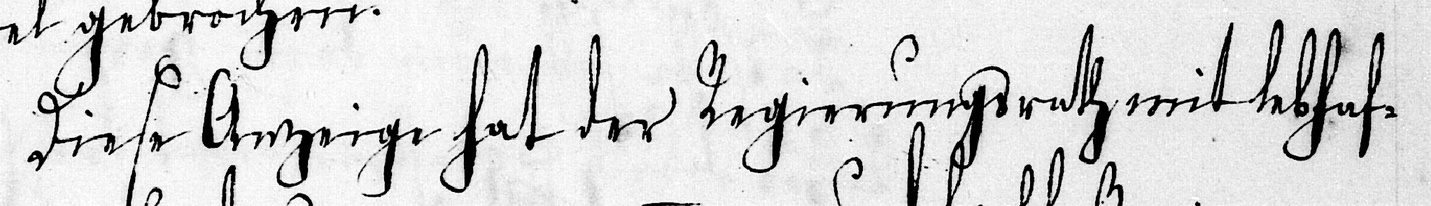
Diese Anzeige hat der Regierungsrath mit lebhaf¬
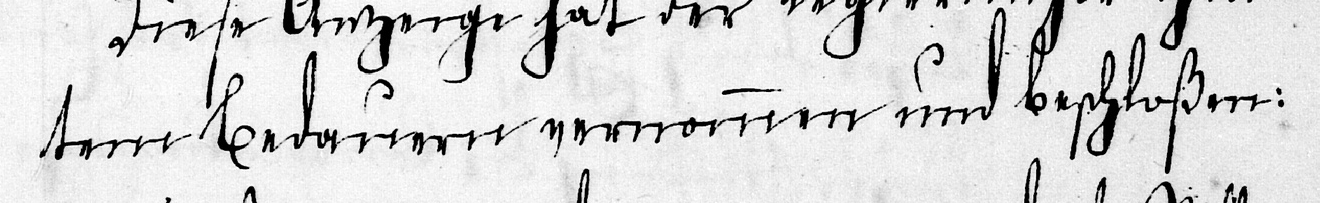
tem Bedauern vernommen und beschloßen:
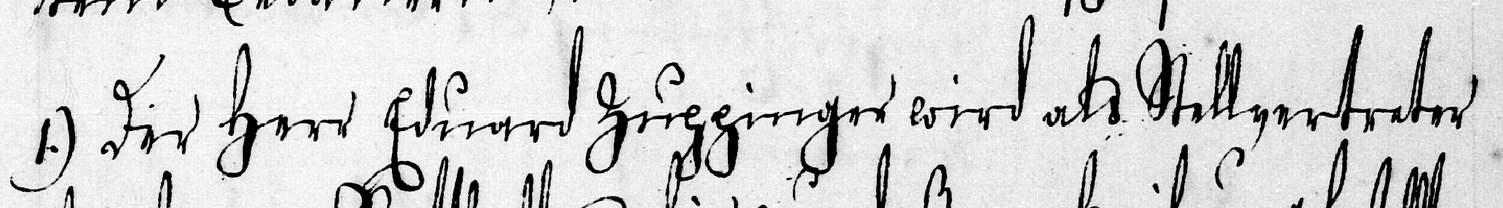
1.) Der Herr Eduard Zuppinger wird als Stellvertreter
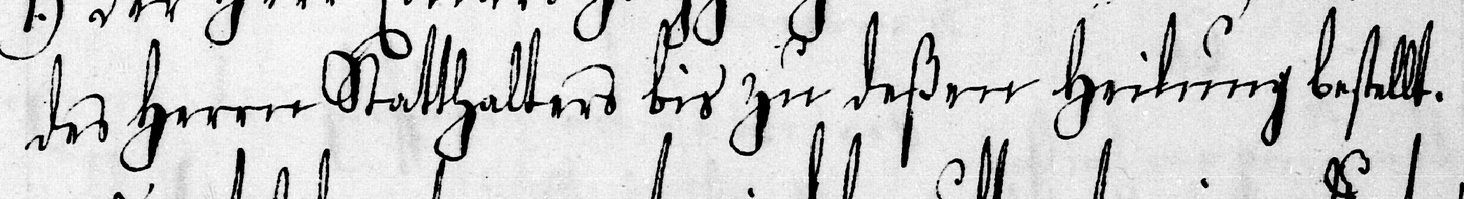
des Herrn Statthalters bis zu deßen Heilung bestel¬
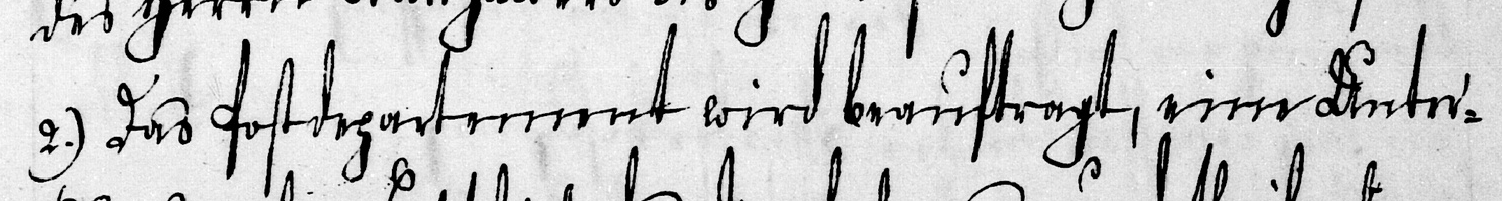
2.) Das Postdepartement wird beauftragt, eine Unter¬
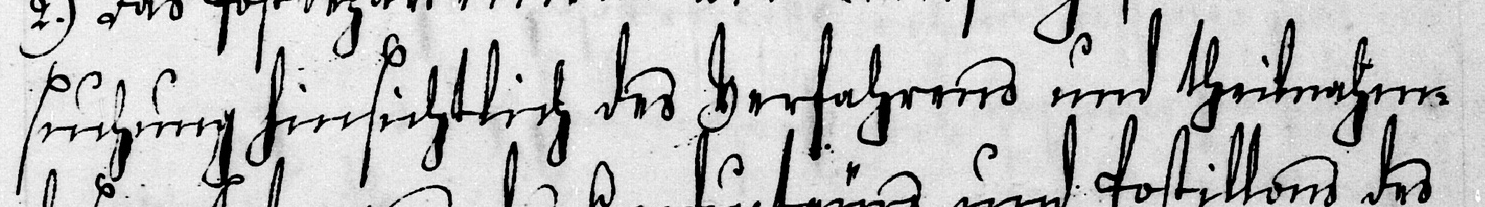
suchung hinsichtlich des Verfahrens und theilnahm¬
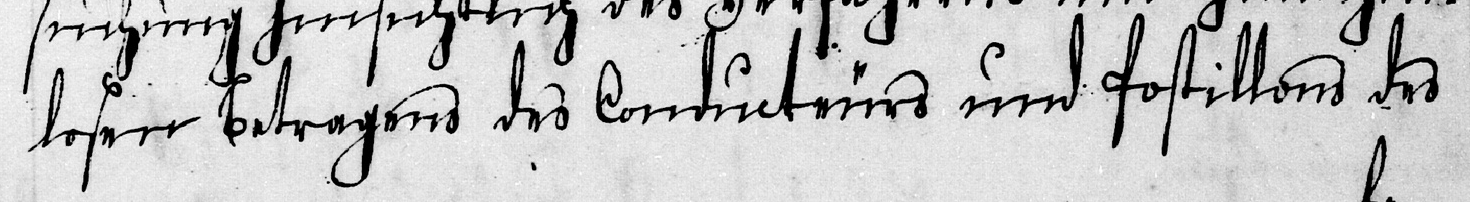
losen Betragens des Conducteurs und Postillons des
